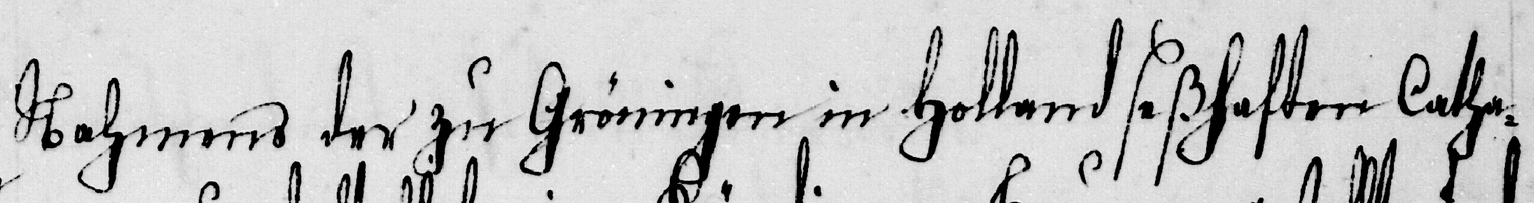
Nahmens der zu Gröningen in Holland seßhaften Catha¬
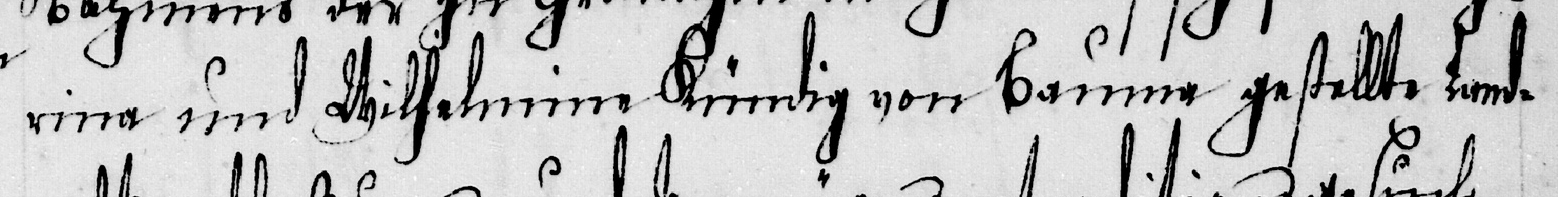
rina und Wilhelmine Kündig von Bauma gestellte Lan¬
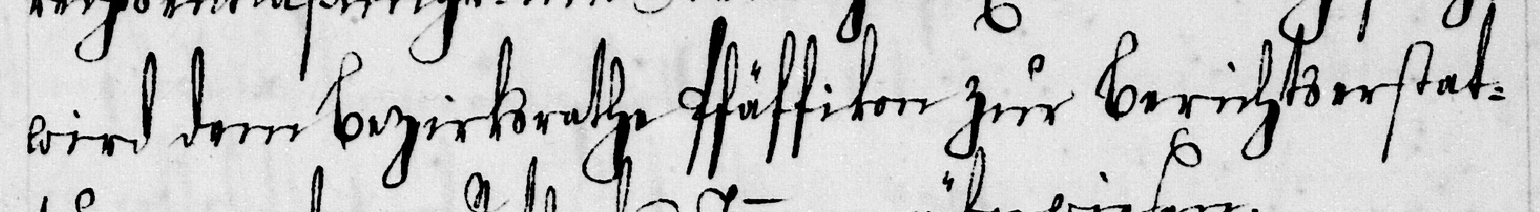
wird dem Bezirksrathe Pfäffikon zur Berichtserstat¬
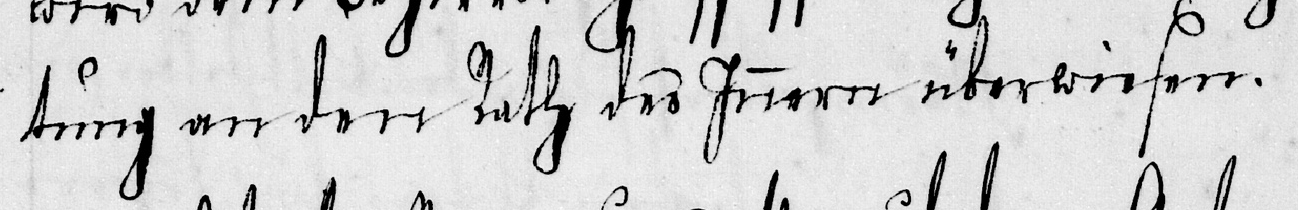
tung an den Rath des Innern überwiesen.
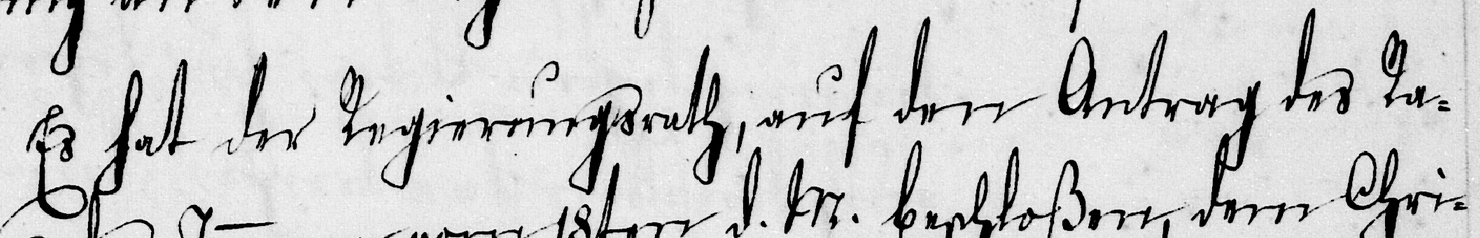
Es hat der Regierungsrath, auf den Antrag des Rat¬
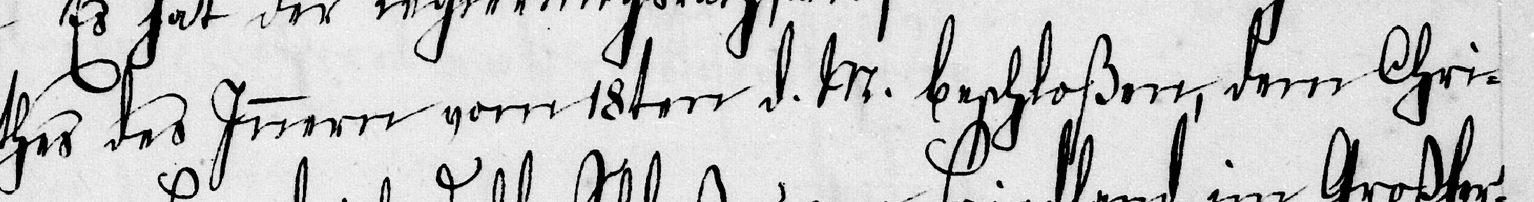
hes des Innern vom 18ten d. M. beschloßen, dem Chri¬
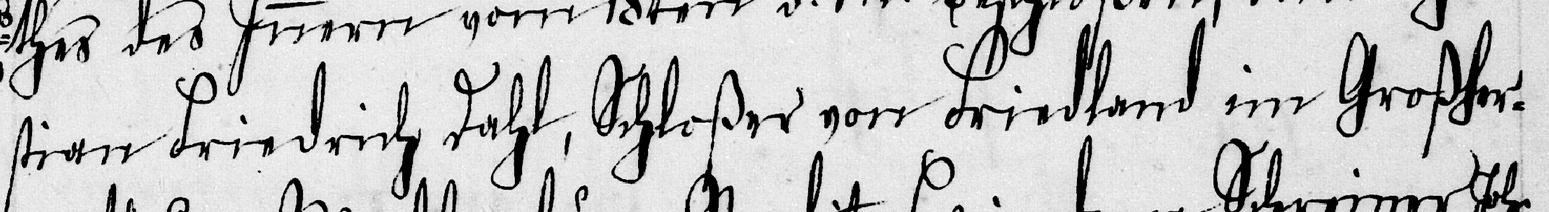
stian Friedrich Dahl, Schloßer von Friedland im Großher¬
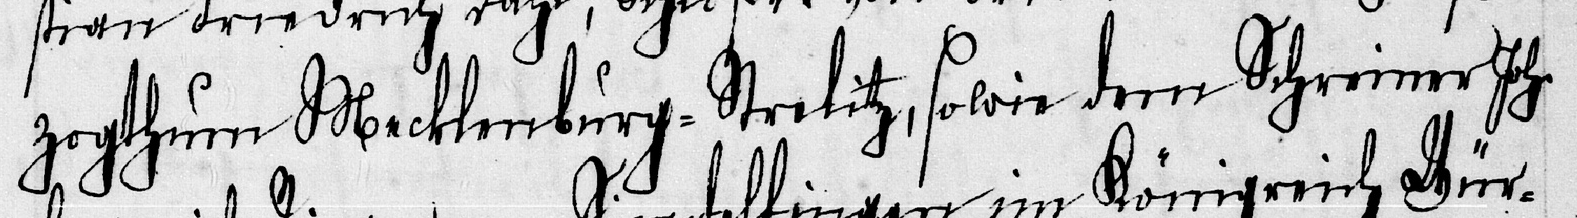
zogthum Mecklenburg-Strelitz, sowie Schreiner Joh.
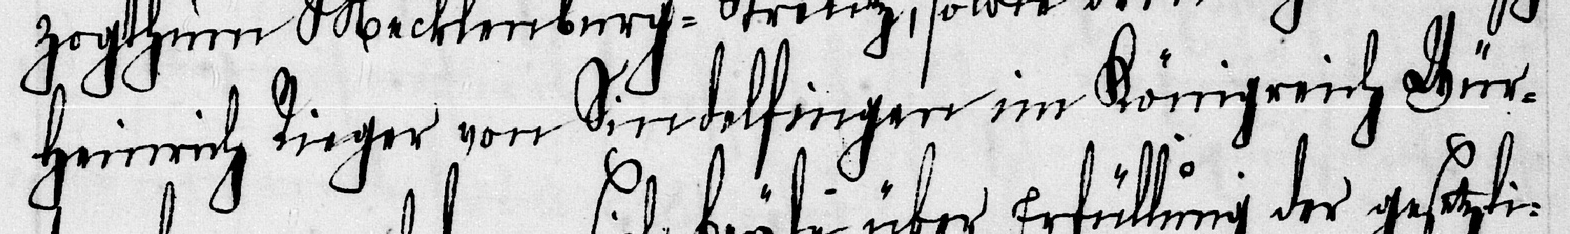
Heinrich Rieger von Sindelfingen im Königreich Wür¬
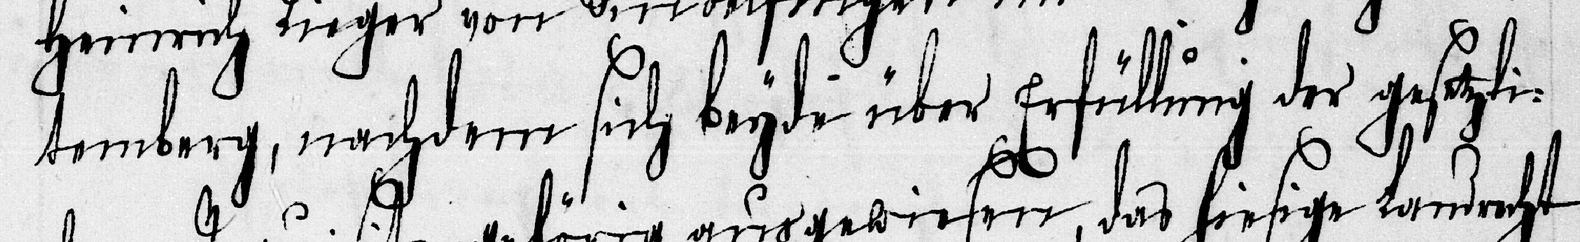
temberg, nachdem sich beyde über Erfüllung der gesetz¬
